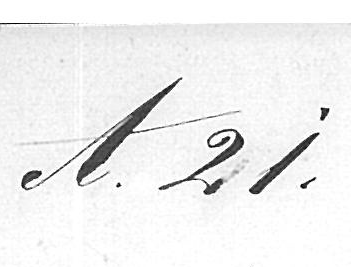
A. 21.
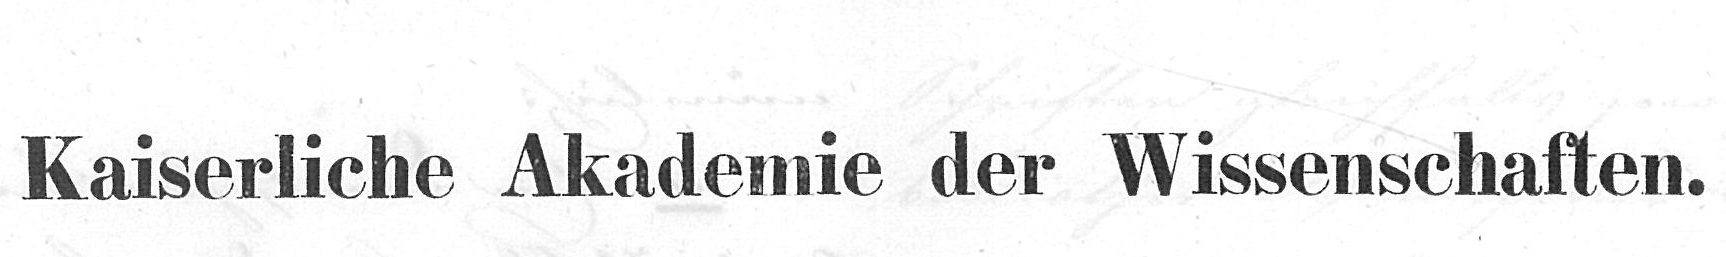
Kaiserliche Akademie der Wissenschaften.
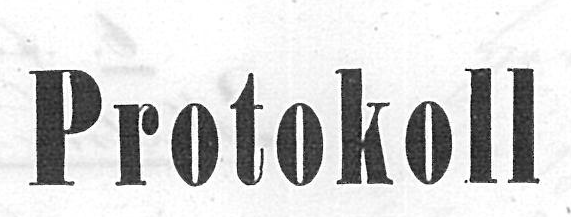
Protokoll
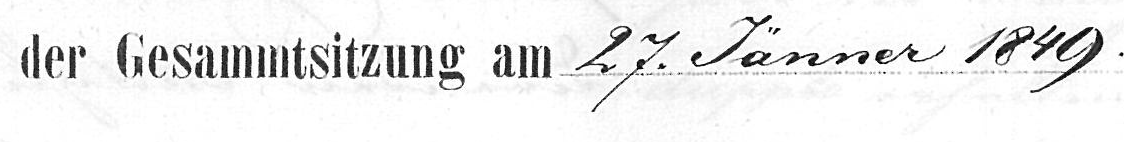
der Gesammtsitzung am 27. Jänner 1849
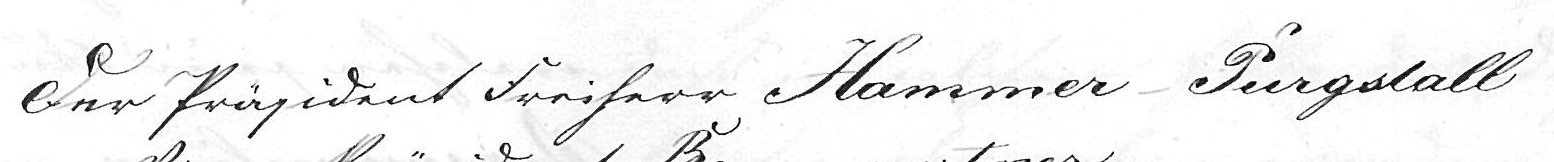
Der Präsident Freiherr Hammer-Purgstall
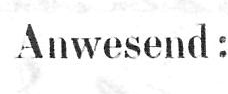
Anwesend:
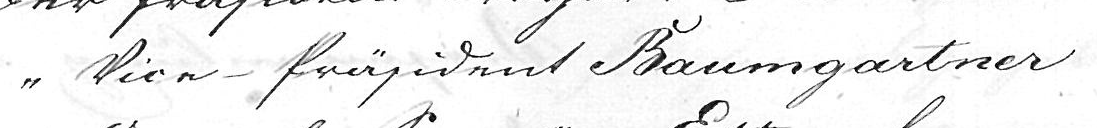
" Vice-Präsident Baumgartner
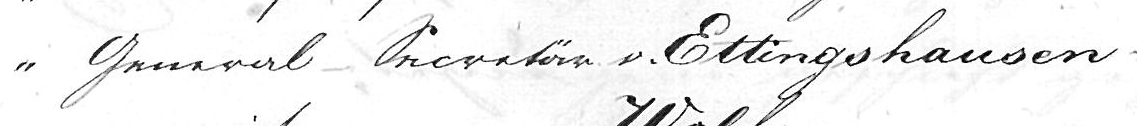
" General-Secretär v. Ettingshausen
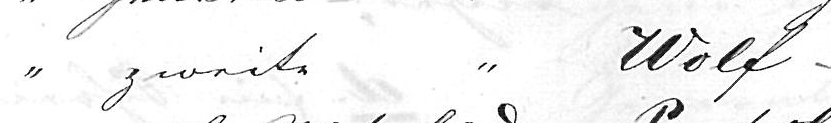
" zweite " Wolf
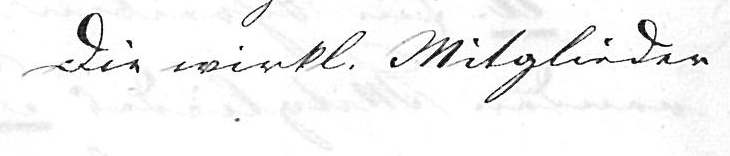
Die wirkl. Mitglieder
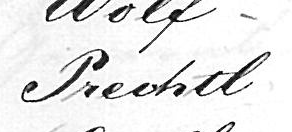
Prechtl
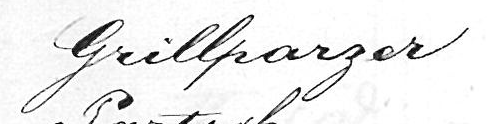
Grillparzer
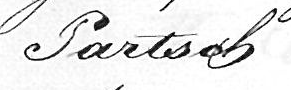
Partsch
